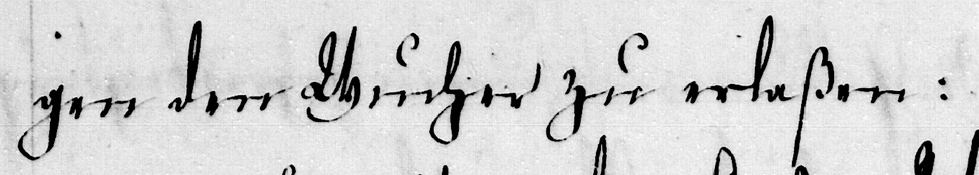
gen den Wucher zu erlaßen:
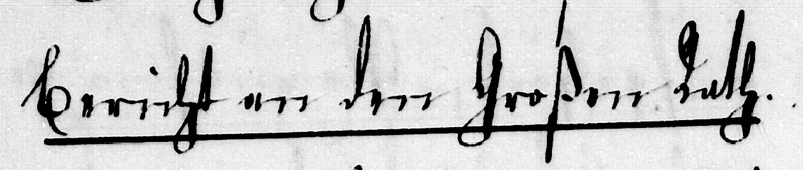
Bericht an den Großen Rath.
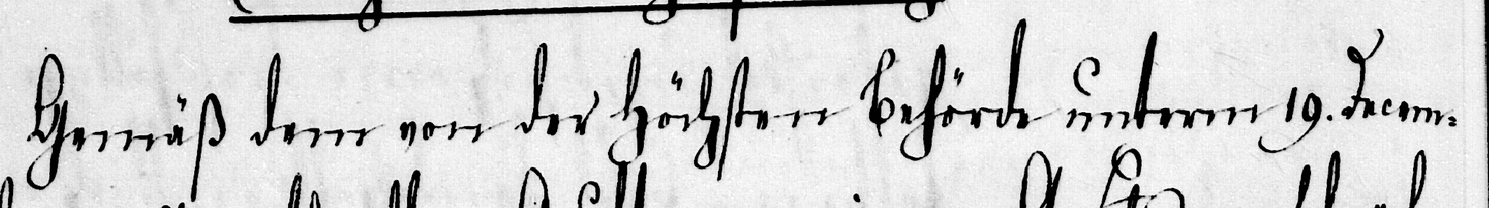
Gemäß dem von der Höchsten Behörde unterm 19. Decem¬
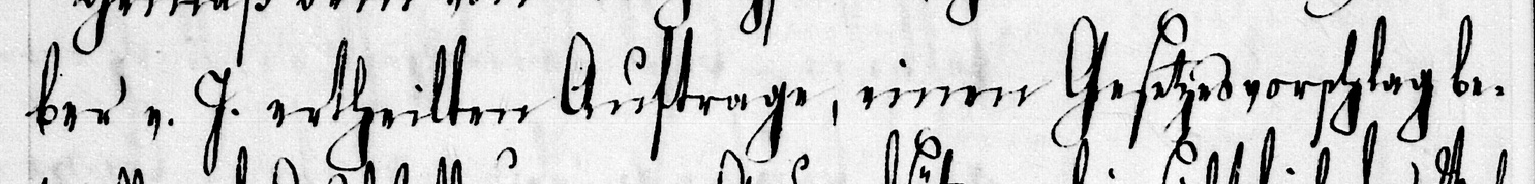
ber v. J. ertheilten Auftrage, einen Gesetzesvorschlag be¬
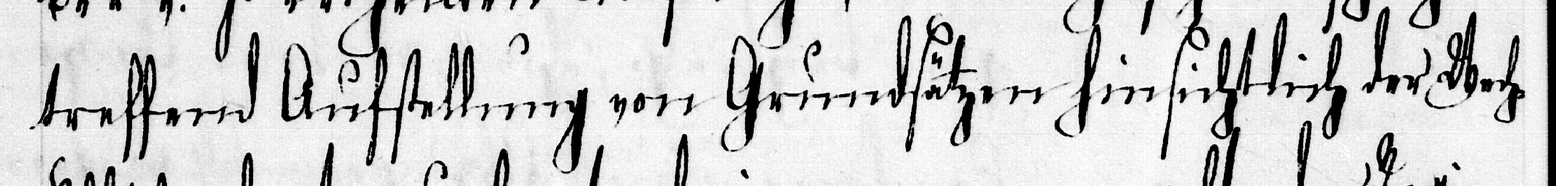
treffend Aufstellung von Grundsätzen hinsichtlich der Wec¬
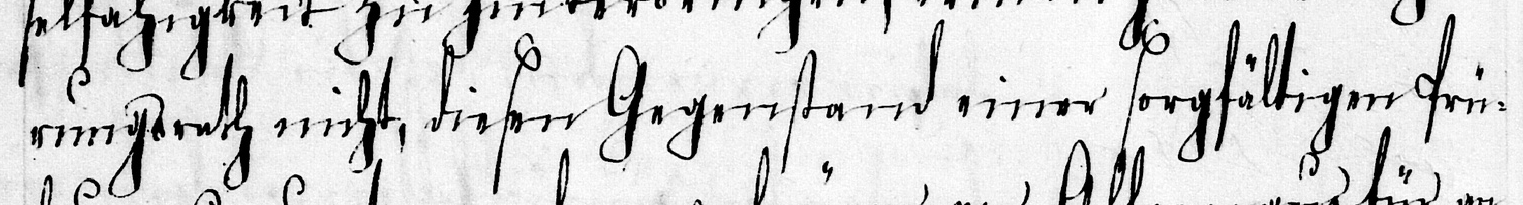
rungsrath nicht, diesen Gegenstand einer sorgfältigen Prü¬
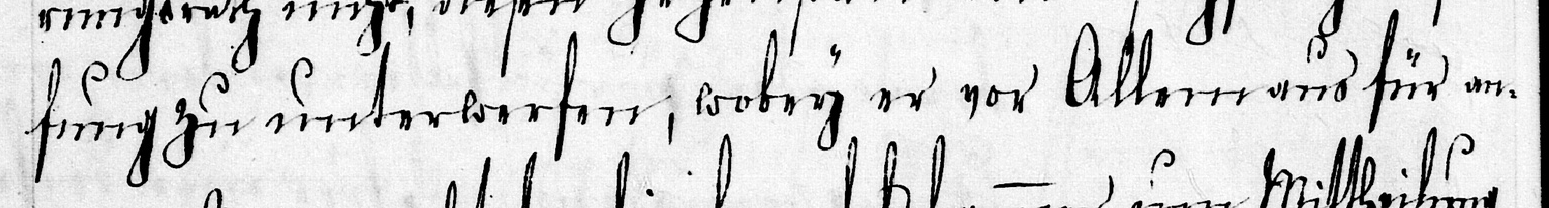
fung zu unterwerfen, wobey er vor Allem aus für an¬
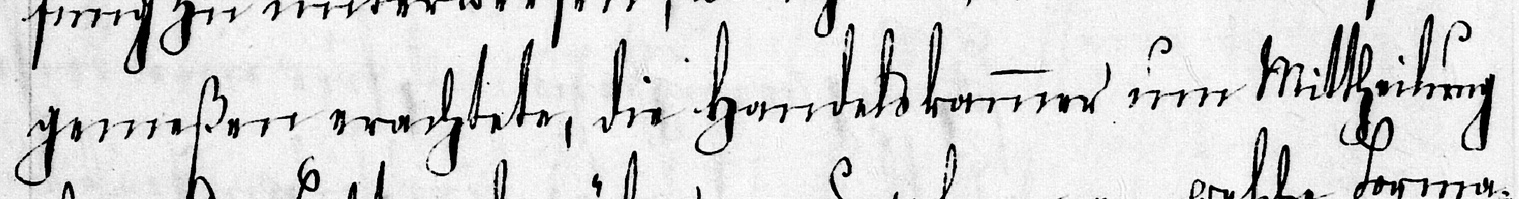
gemeßen erachtete, die Handelskammer um Mittheilung
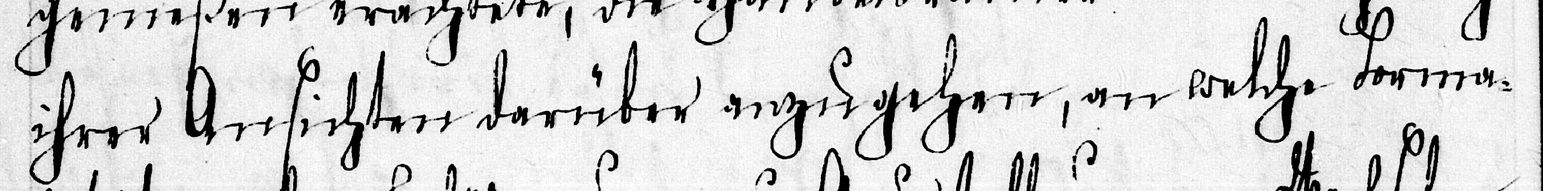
ihrer Ansichten darüber anzugehen, an welche Forma¬
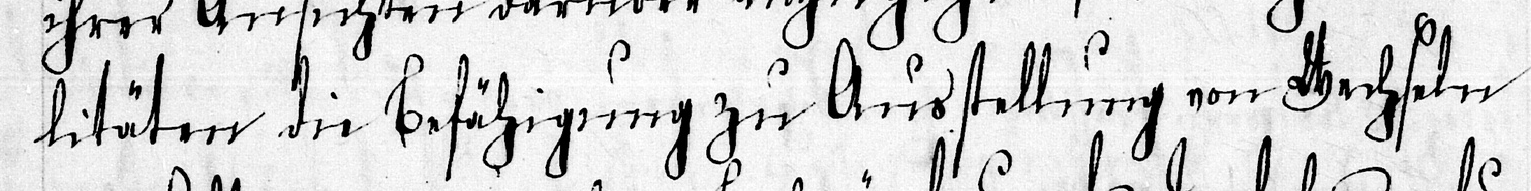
litäten die Befähigung zu Ausstellung von Wechseln
